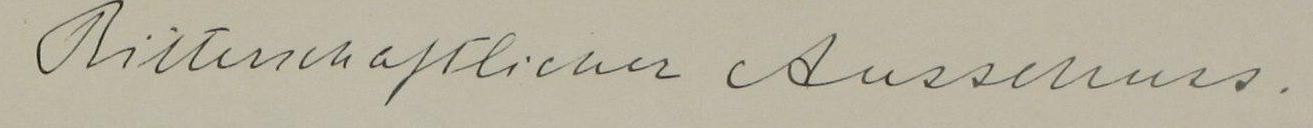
Ritterschaftlicher Ausschuss
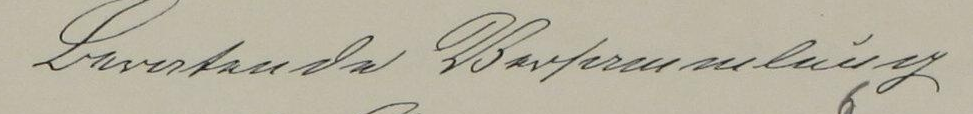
Beratende Versammlung
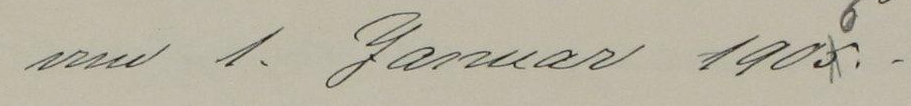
am 1. Januar 1905.
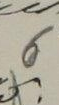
6
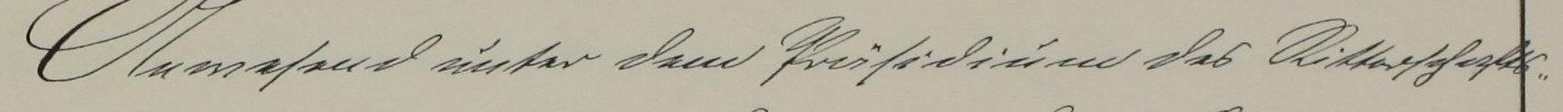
Anwesend unter dem Präsidium des Ritterschafts-
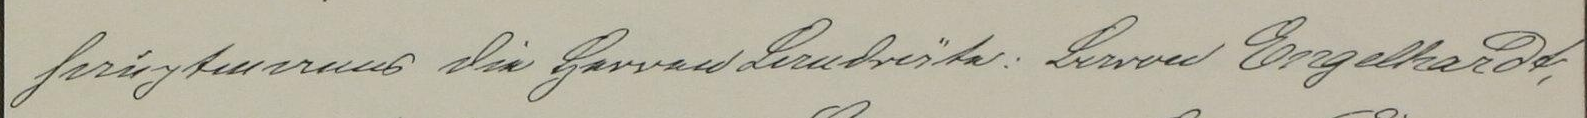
hauptmanns die Herren Landräte: Baron Engelhardt,
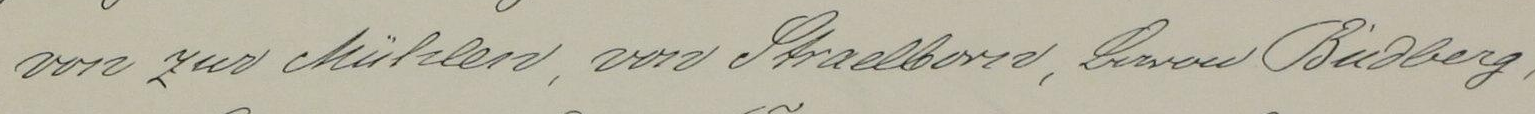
von zur Mühlen, von Straelborn, Baron Budberg,
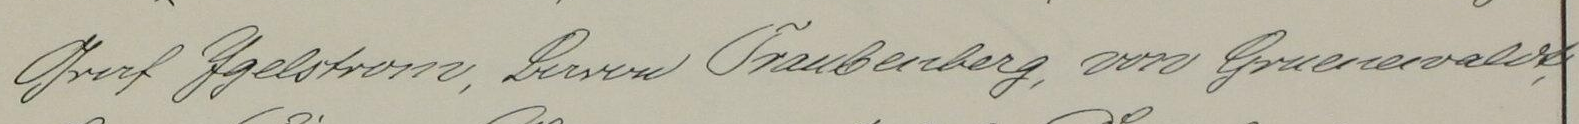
Graf Igelstrom, Baron Traubenberg, von Gruenewaldt,
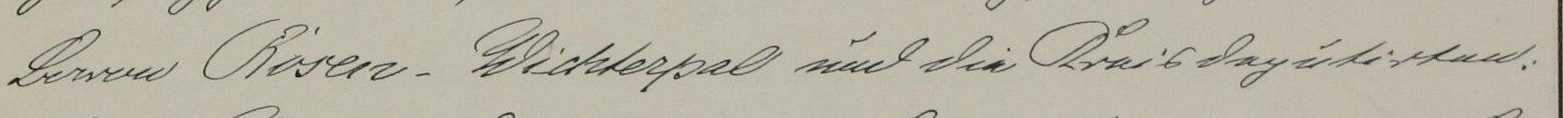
Baron Rosen-Wichterpal und die Kreisdeputirten:
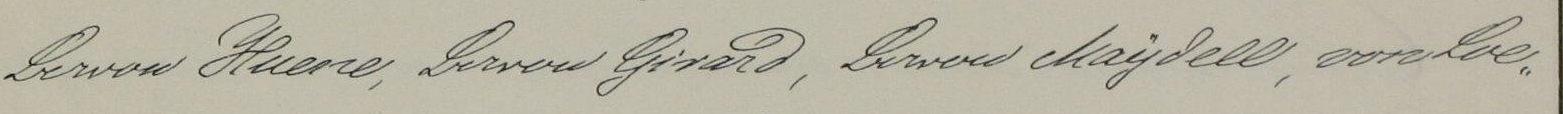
Baron Huene, Baron Girard, Baron Maydell, von Loe-
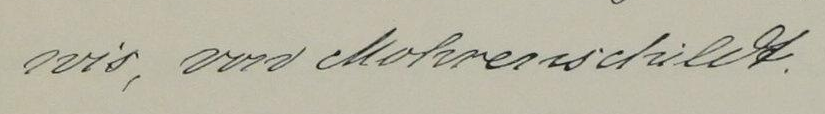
wis, von Mohrenschildt.
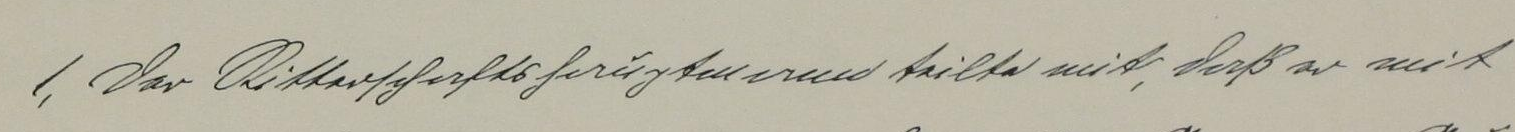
1. Der Ritterschaftshauptmann teilte mit, daß er mit
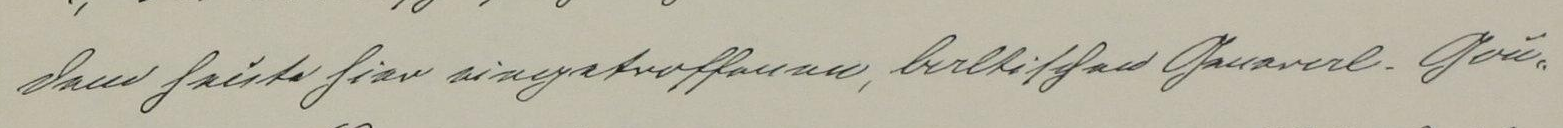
dem heute hier eingetroffenen baltischen General-Gou-
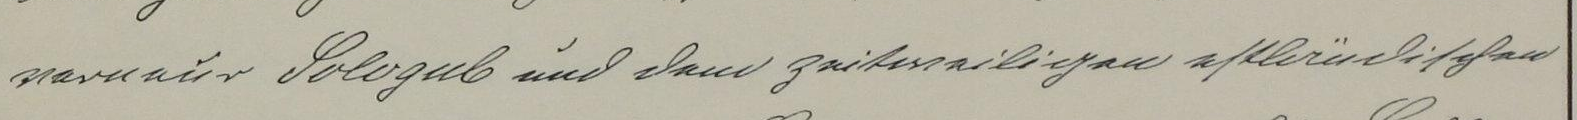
verneur Sologub und dem zeitweiligen estländischen
